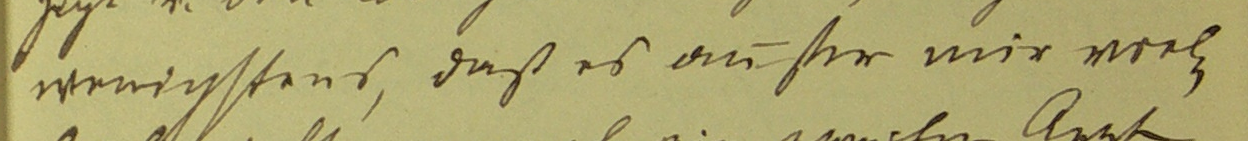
wenigstens , daß es außer mir viel¬
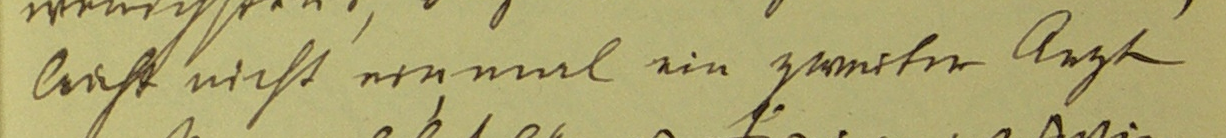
leicht nicht einmal ein zweiter Arzt
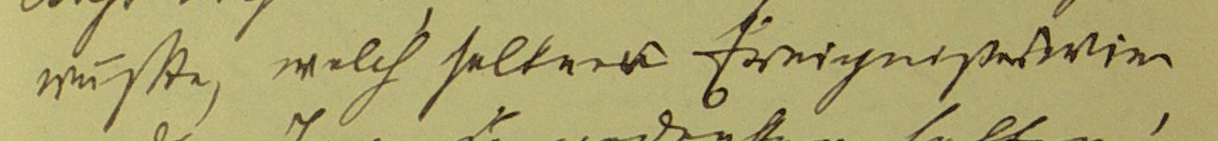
wußte , welch seltenes Erreignis wir
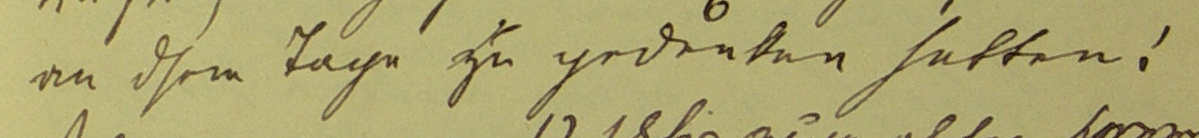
an diesem Tage zu gedenken hatten !-
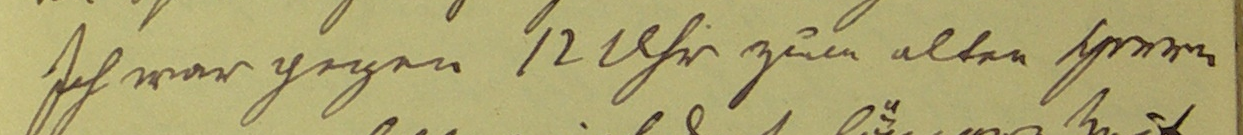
Ich war gegen 12 Uhr zum alten Herrn
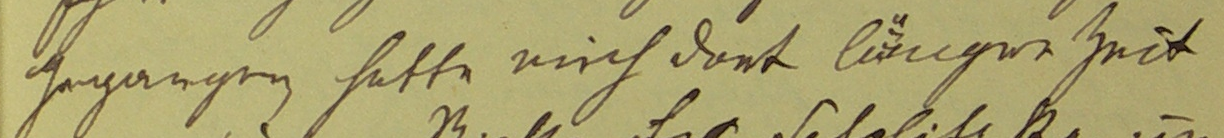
gegangen hatte mich dort längere Zeit
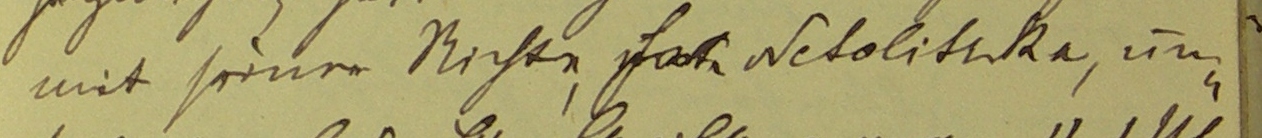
mit seiner Nichte, Fr. Netolitcka, un¬
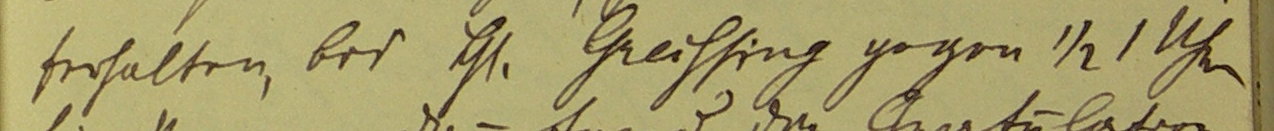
terhalten, bis H. Geisting gegen ½ 1 Uhr
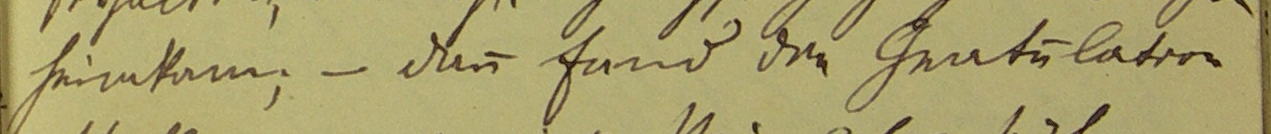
heimkam;- dann fand die Gratulation
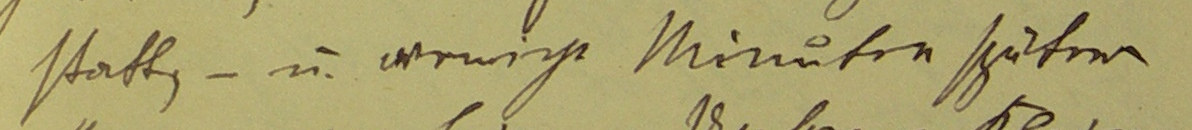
statt,- und einige Minuten später
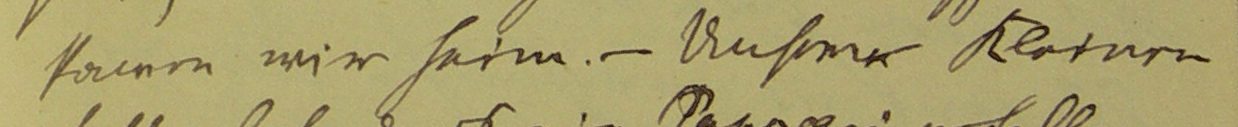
kamen wir heim.-Unseren Kleinen
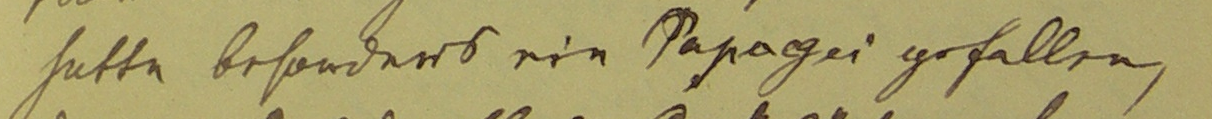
hatte besonders ein Papagei gefallen
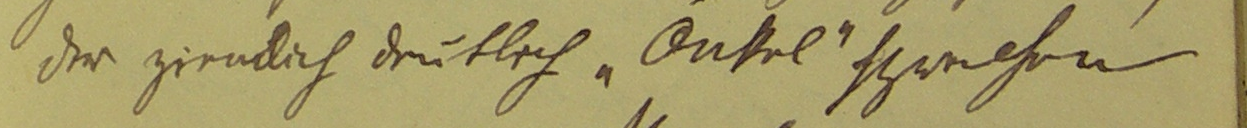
der ziemlich deutlich „ Onkel“ sprechen
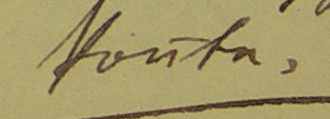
konnte
